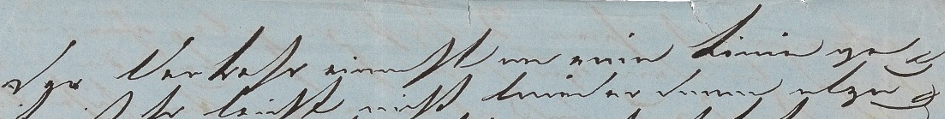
Der Verkehr einmahl an eine Linie ge-
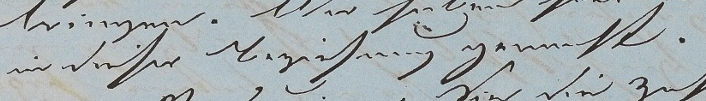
in dieser Beziehung gemacht.
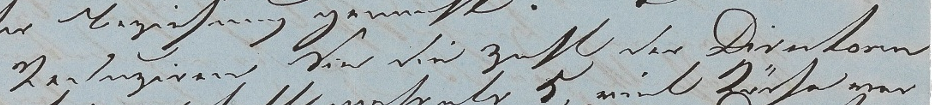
Reduziren Sie die Zahl der Directoren
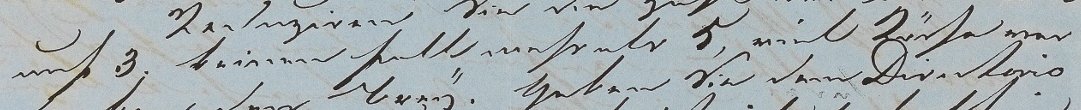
auf 3; keinen Fall mehr als 5, viel Köche ver-
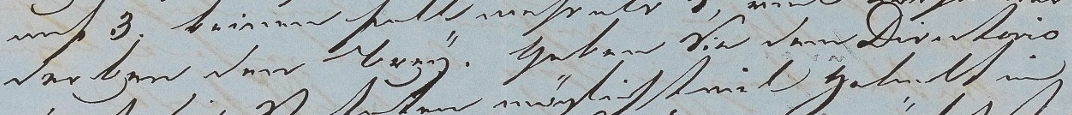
derben den Brey. Geben Sie dem Directorio
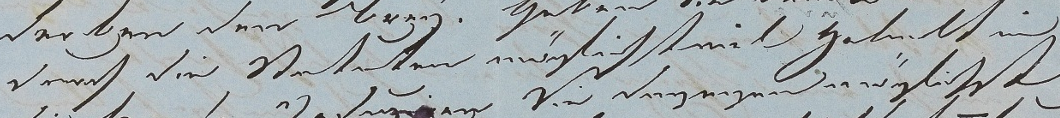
darauf die Statuten möglichst viel Gewalt in
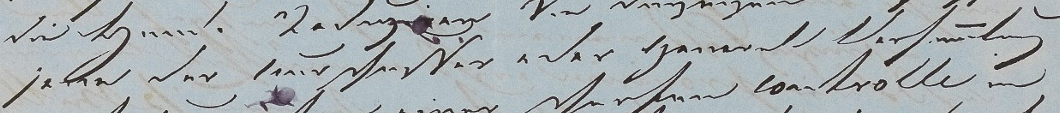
jene des Ausschusses & der General-Versammlung
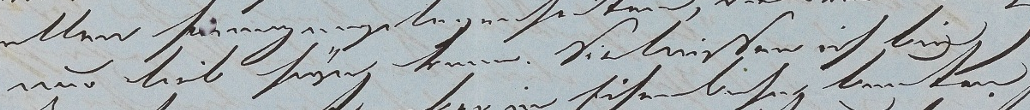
nur lieb seyn kann. Sie wissen ich bin
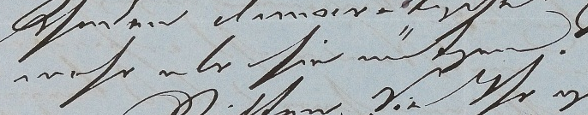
mehr als sie nützen.
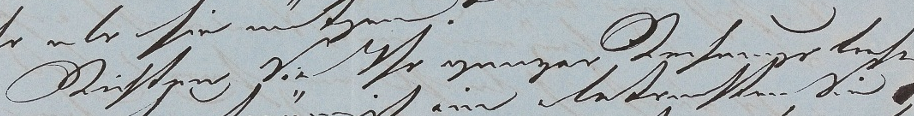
Richten Sie Ihr ganzes Rechnungswesenen
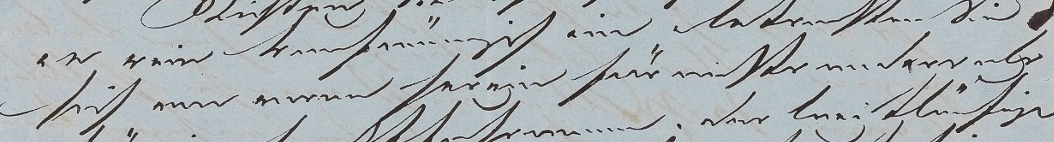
sich von vorne herein für nichts anders als
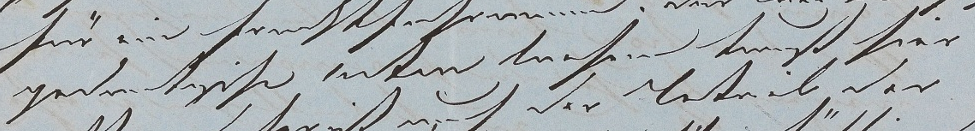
pedantische acten wesen taugt hier
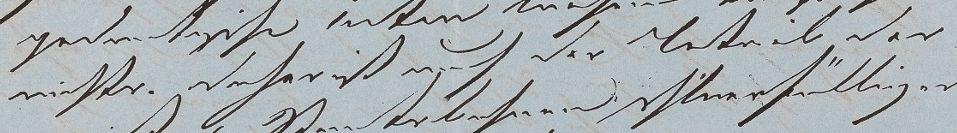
nichts. Daher ist auch der Betrieb der
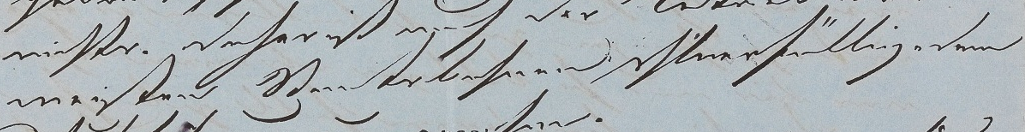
meisten Staatsbahnen schwerfällig & dem
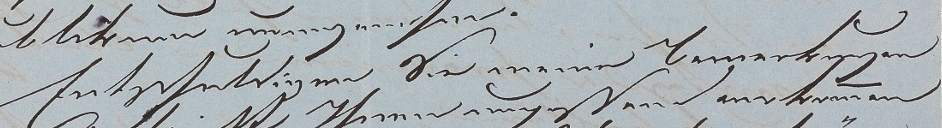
Entschuldigen Sie meine Bemerkungen
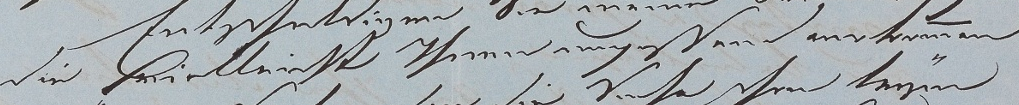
die vielleicht Ihnen unpaßend vorkommen
